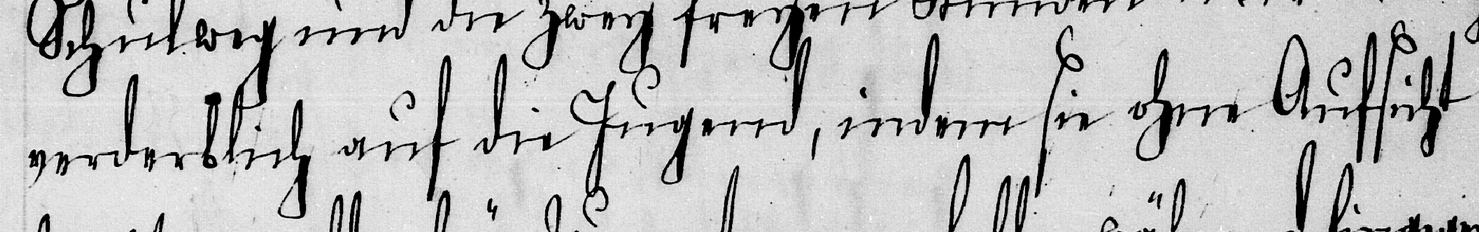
verderblich auf die Jugend, indem sie ohne Aufsicht
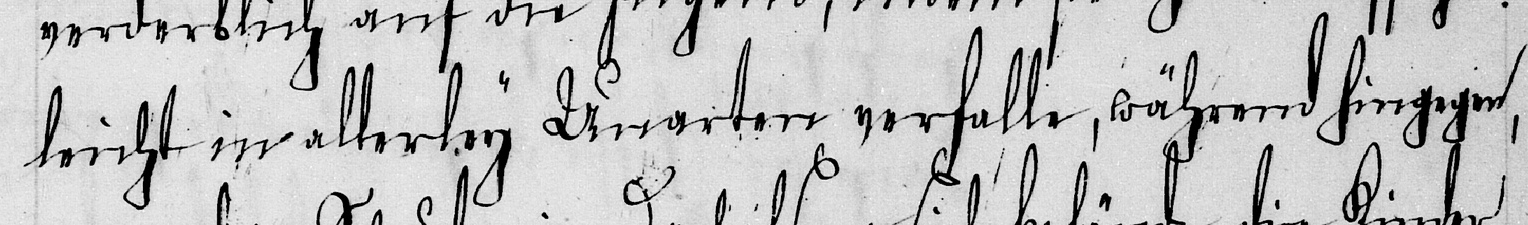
leicht in allerley Unarten verfalle, während hingege¬
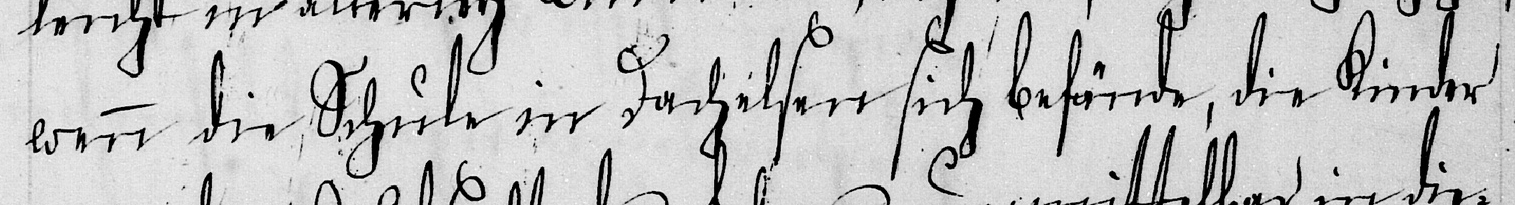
wenn die Schule in Dachelsen sich befände, die Kinder
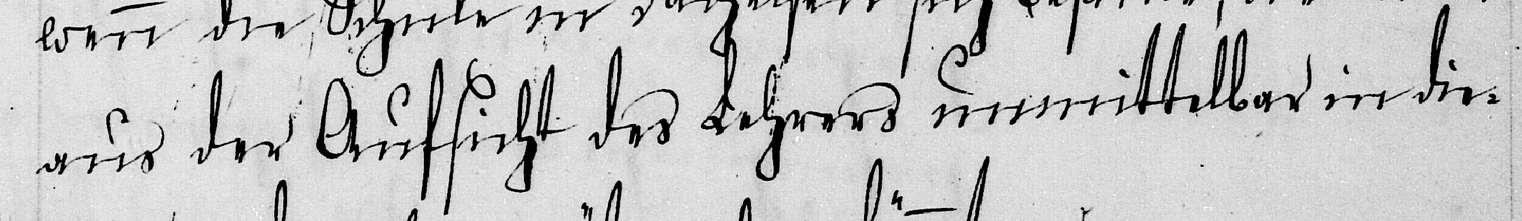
aus der Aufsicht des Lehrers unmittelbar in die¬
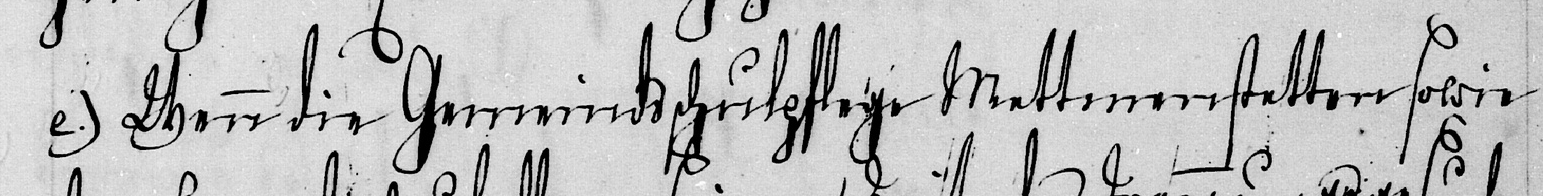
e.) Wenn die Gemeindschulpflege Mettmenstetten sowie
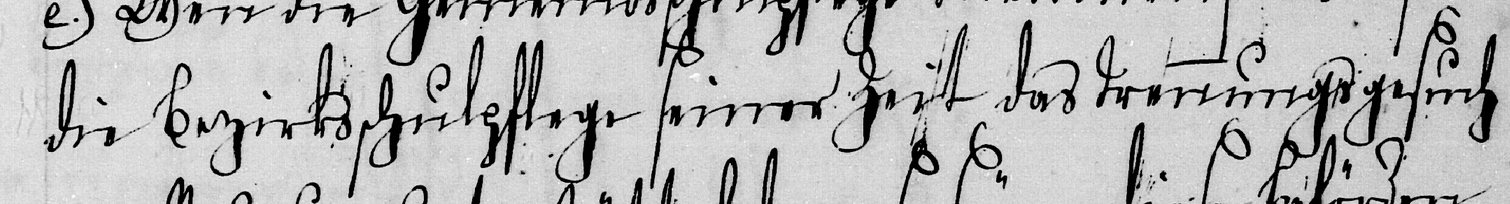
die Bezirksschulpflege seiner Zeit das Trennungsgesuch
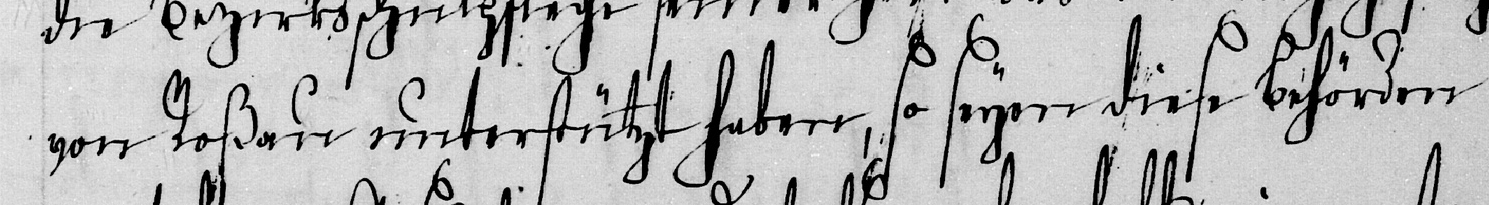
von Roßau unterstützt haben, so seyen diese Behörden
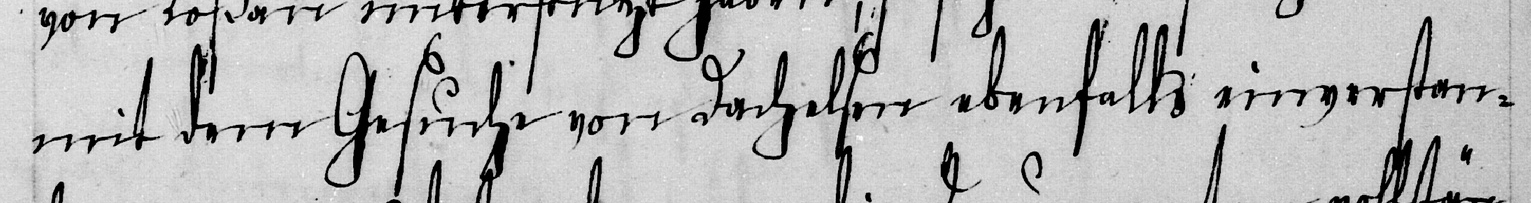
mit dem Gesuche von Dachelsen ebenfalls einverstan¬
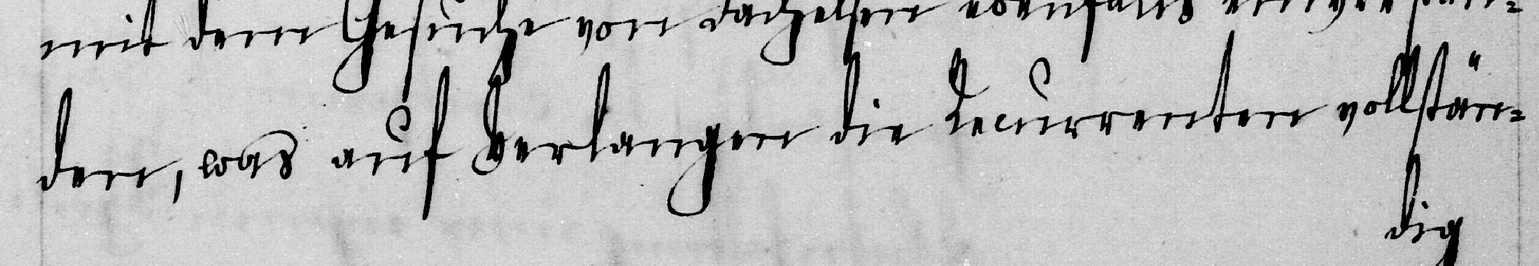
den, was auf Verlangen die Recurrenten vollstän-
